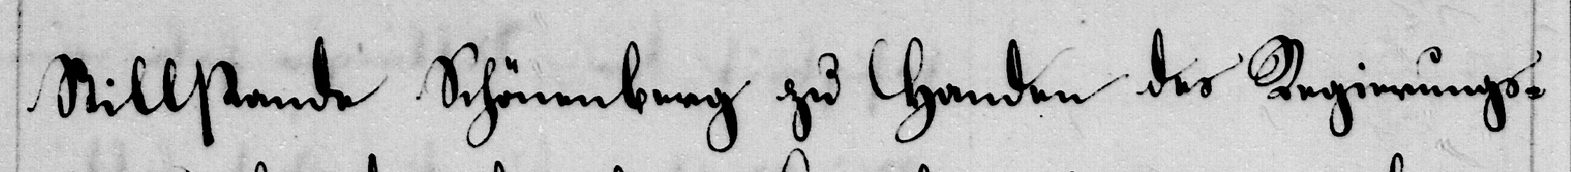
Stillstande Schönenberg zu Handen des Regierungs¬
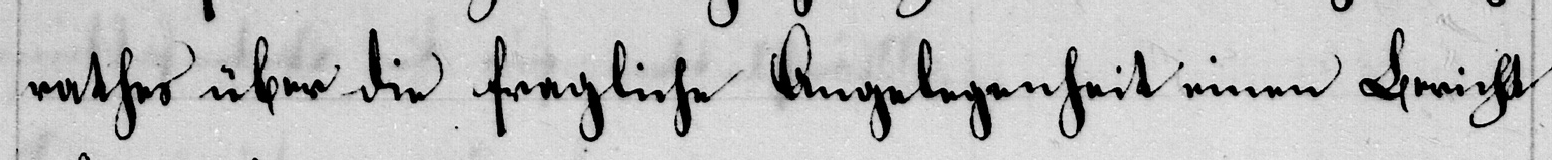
rathes über die fragliche Angelegenheit einen Bericht
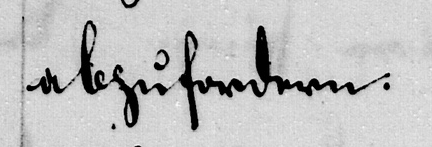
abzufordern.
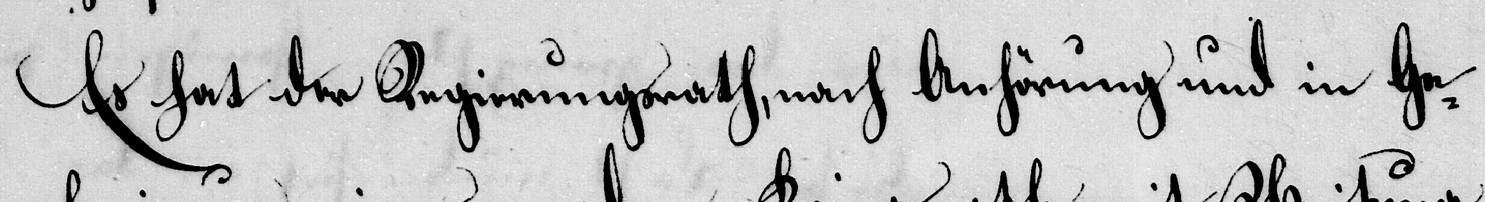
Es hat der Regierungsrath, nach Anhöhrung und in Ge¬
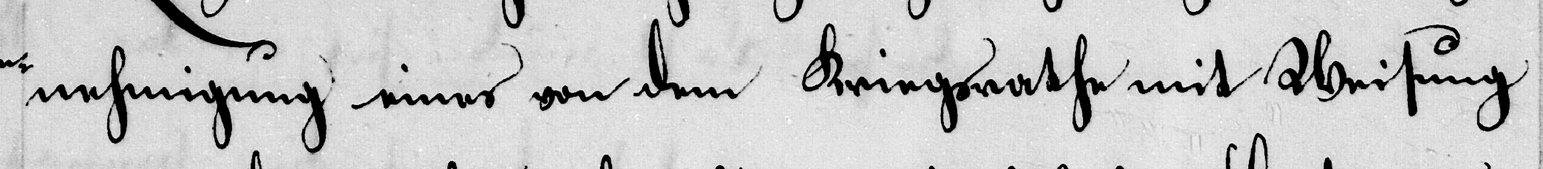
nehmigung eines von dem Kriegsrathe mit Weisung
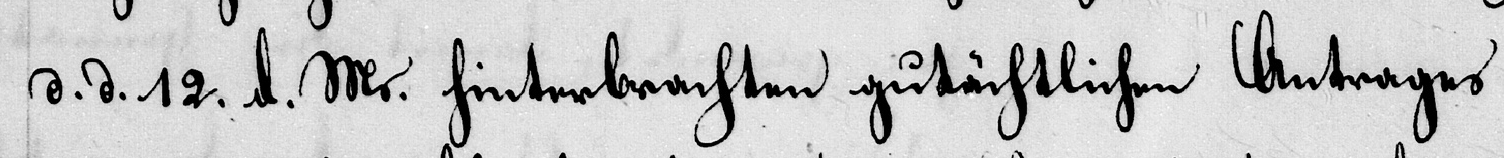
d. d. 12. d. Ms. hinterbrachten gutächtlichen Antrages
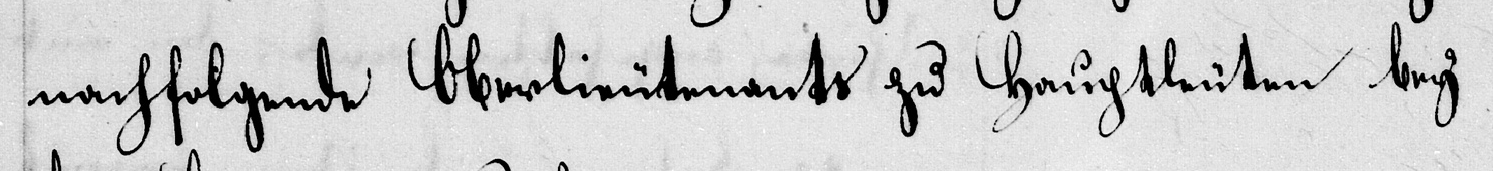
nachfolgende Oberlieutenants zu Hauptleuten bey
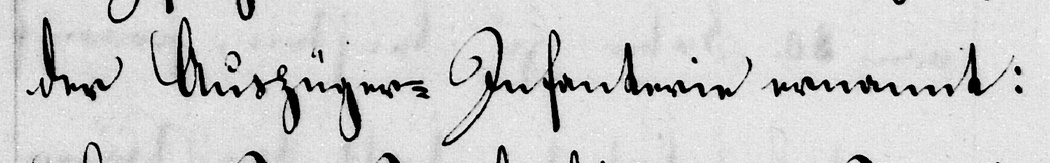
der Auszüger-Infanterie ernannt:
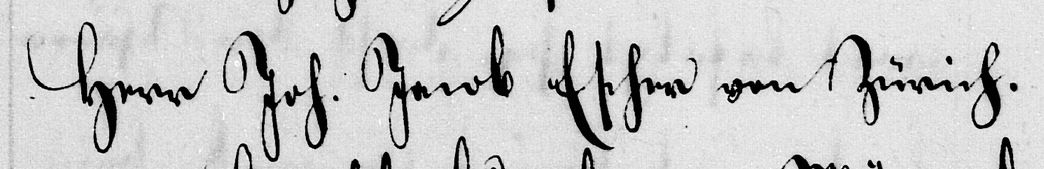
Herr Joh. Jacob Escher von Zürich.
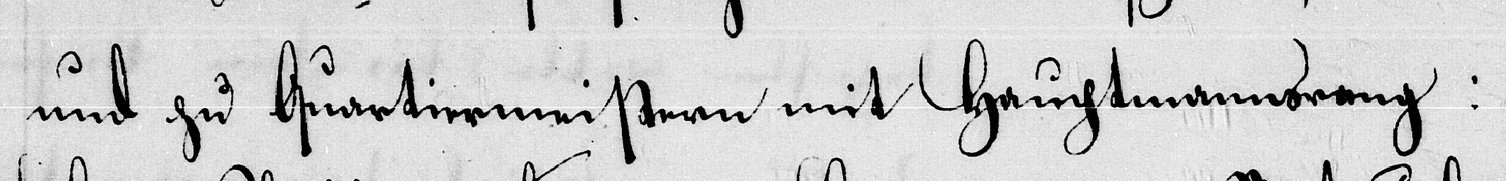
und zu Quartiermeistern mit Hauptmannsrang:
